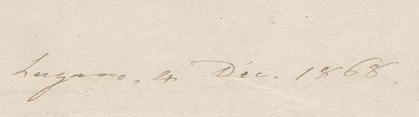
Lugano, 4 Déc. 1868.
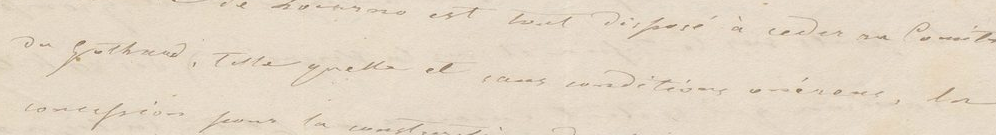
du Gothard, telle quelle et sans conditions onéreux, la
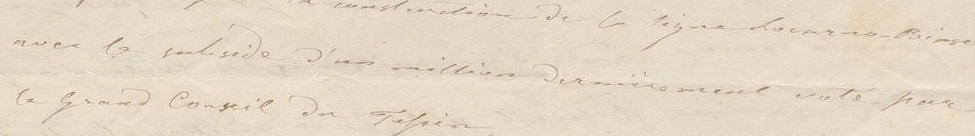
avec le subside d'un million dernièrement voté par
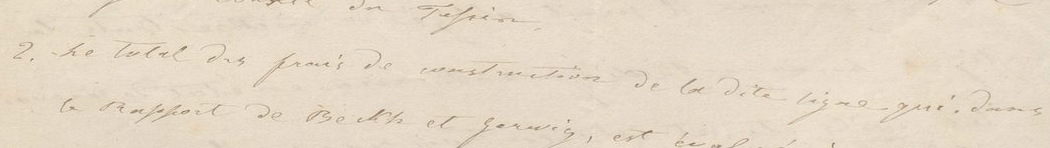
2. Le total des frais de construction de la dite ligne qui dans
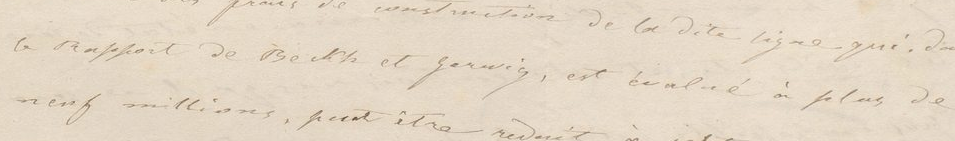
le Rapport de Beckh et Gerwig, est évalué à plus de
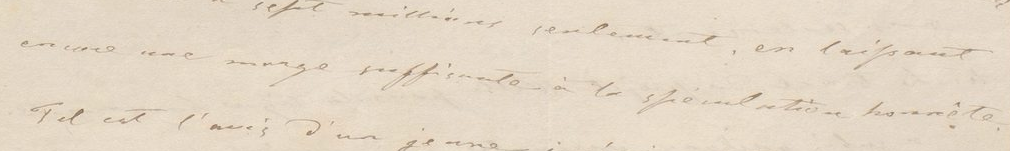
encore une marge suffisante à la spéculation honnête.
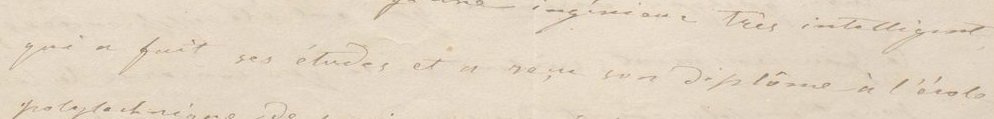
qui a fait ses études et a reçu son diplôme à l'école
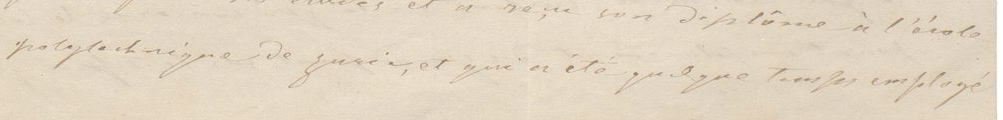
polytechnique de Zuric, et qui a été quelque temps employé
